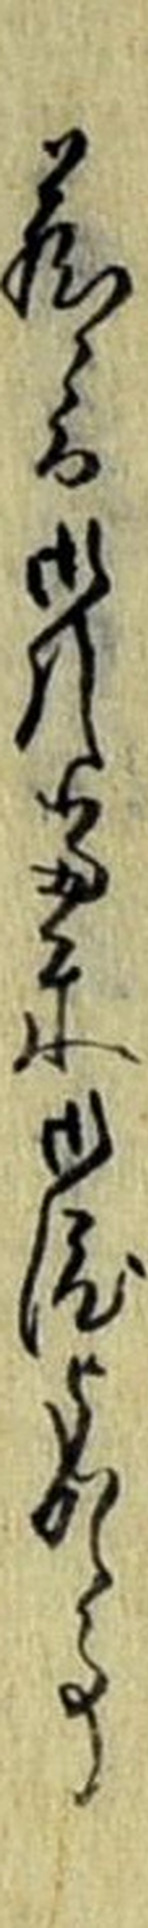蔵に而御引当米御渡被成候事

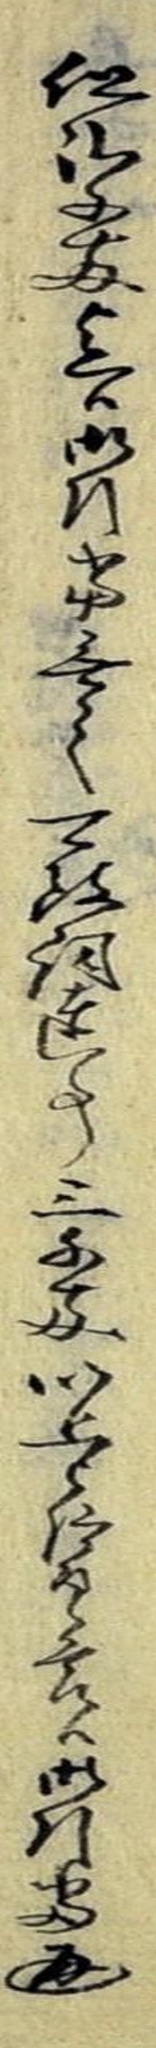但弐千両迄は御引当無之可致調達事三千両以上被仰付候節は御引当通
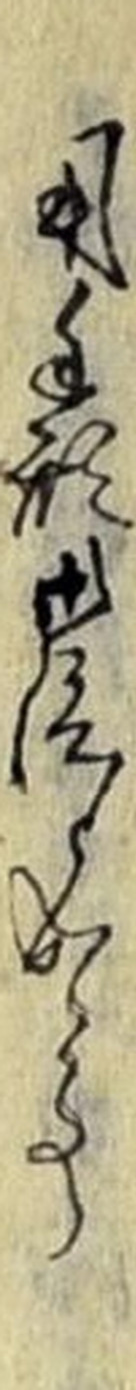用手形御渡被成候事
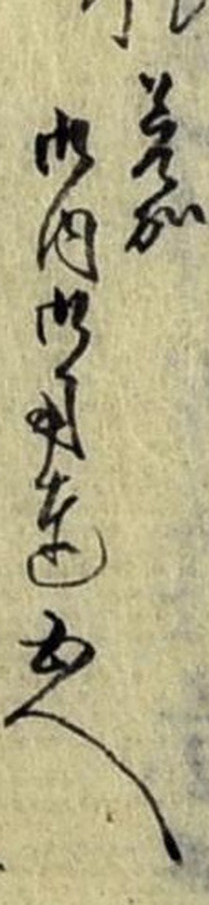御内御用達五人
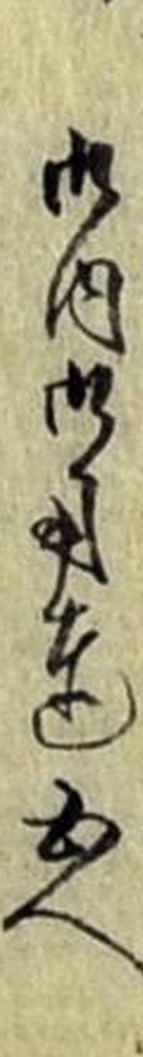御内御用達五人
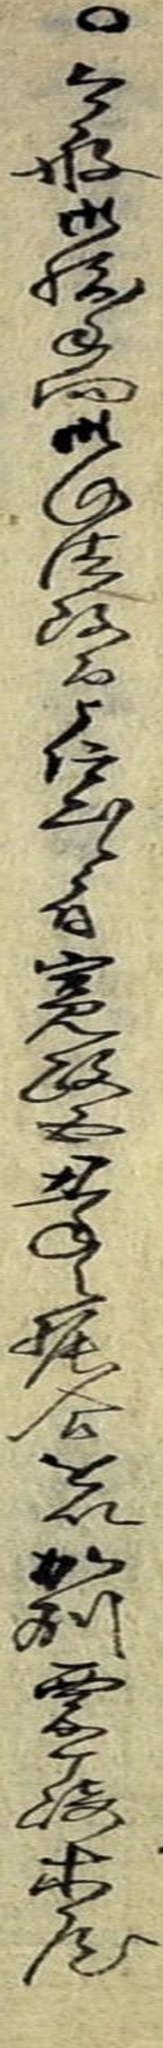○今般御勝手向御趣法改而被仰出候に付寛政五丑年之振合を以加州粟ヶ崎木屋
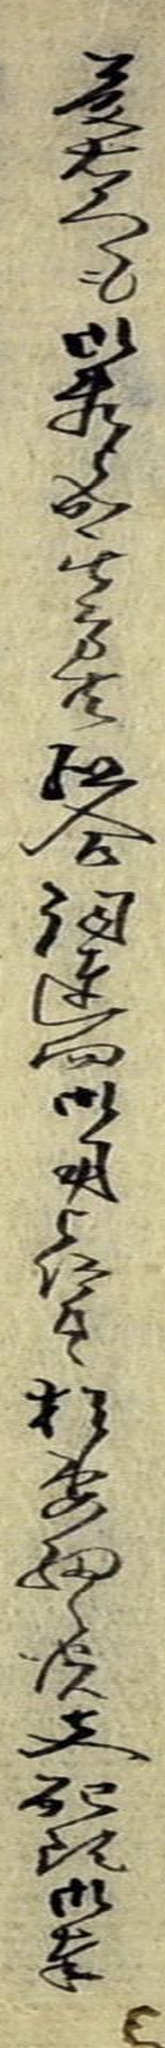藤左衛門へも御頼被成候其方共組合調達向御用被仰付候猶委細之儀は支配頭御
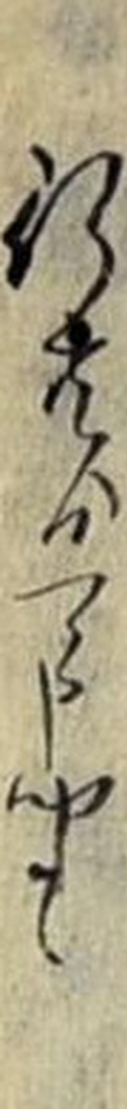奉行共ゟ可申聞候
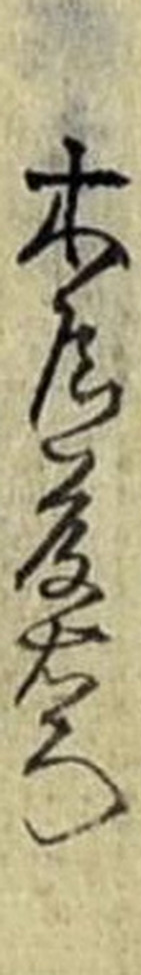木屋藤左衛門
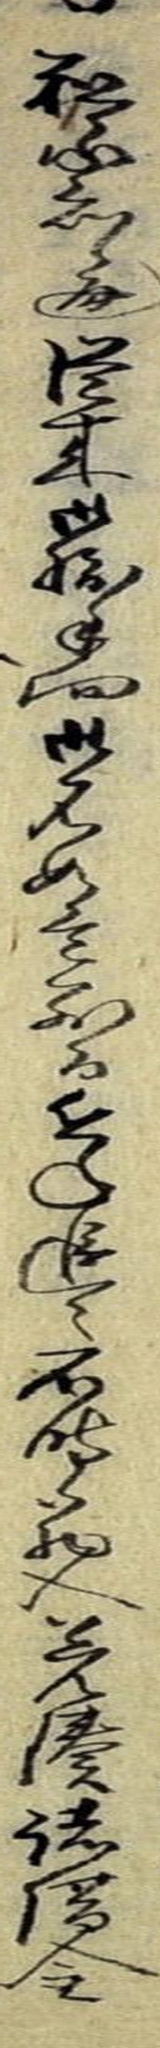○粗承知之通従来御勝手向御不如意別而近年追々不時御物入差湊諸借金
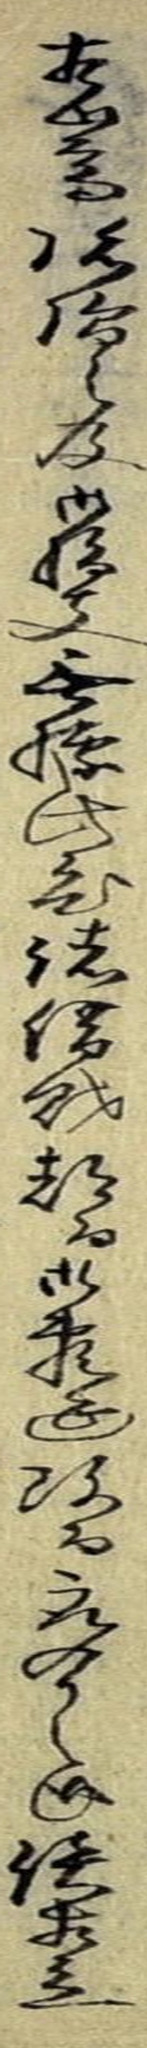相嵩弥増之及御指支無拠此度諸借財都而御頼延改而取〆候趣談相立
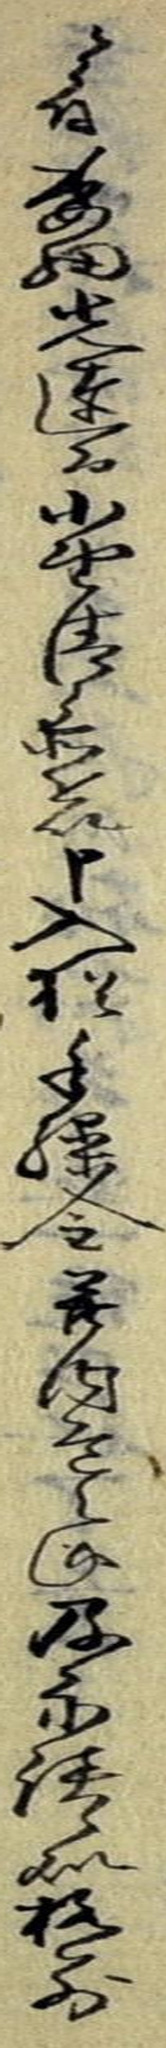候に付委細先達而小野清兵衛を以申入猶手繰金并内意之趣及示談候処格別
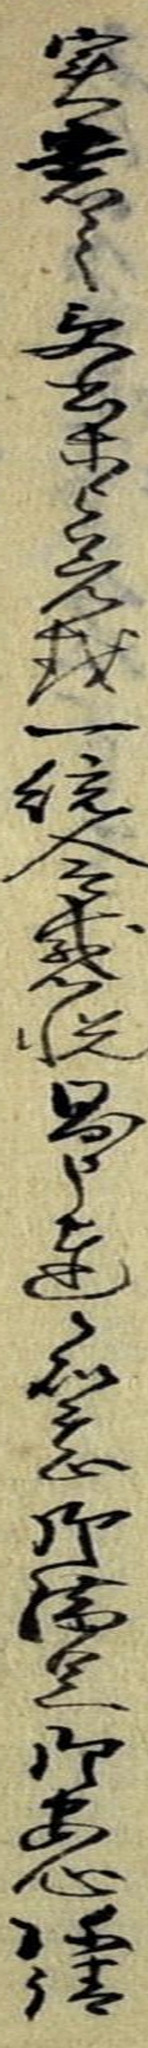実意之受書等被差越一統令感悦則申達候処甚御満足御安心弥請
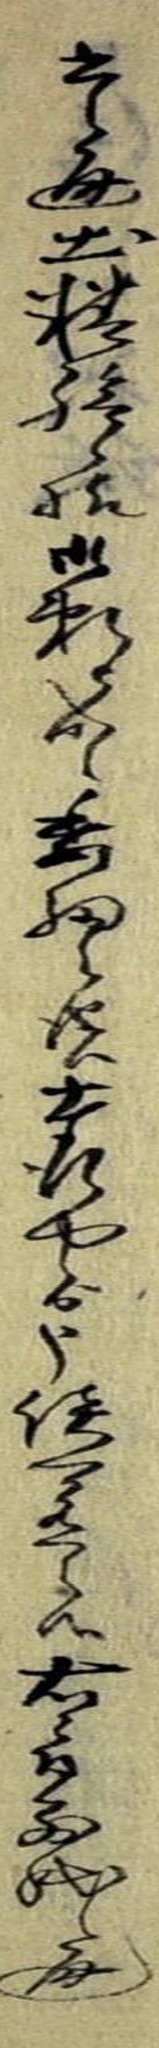書之通出精給候様御頼被成候委細之儀は奉行中ゟ申談可有之候右に付別紙之通
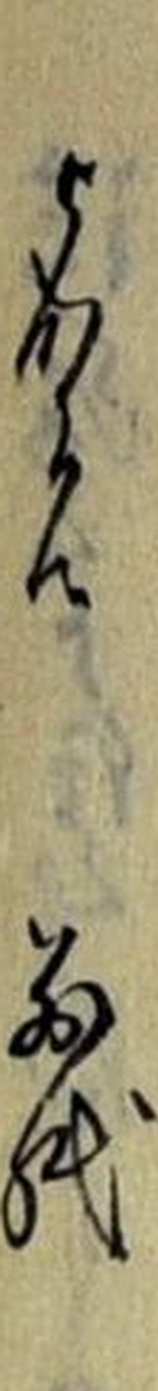被成下候別紙
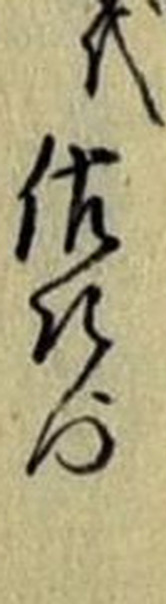次左衛門
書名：命令之部 四
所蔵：福井県文書館 Fukui Prefectural Archives
